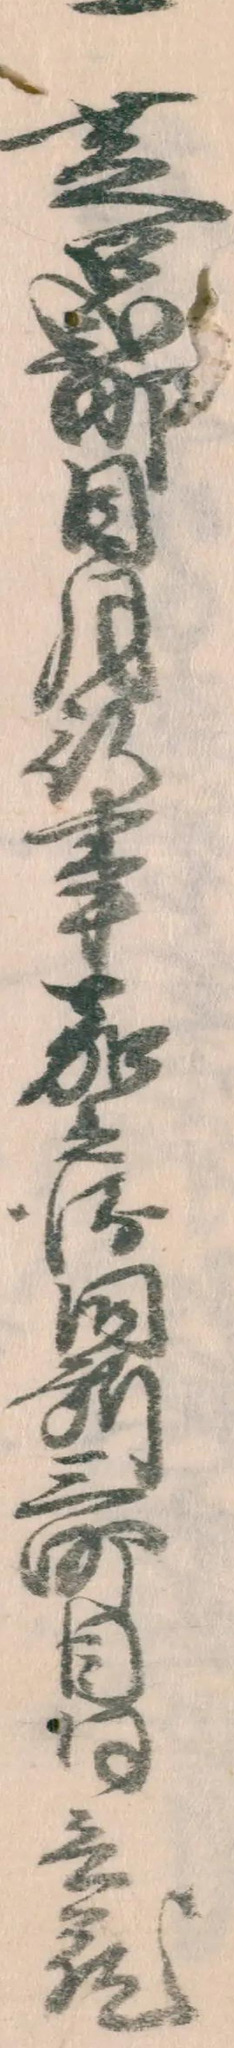一芝口弐町目月行事嘉兵衛同所三町目同兵蔵
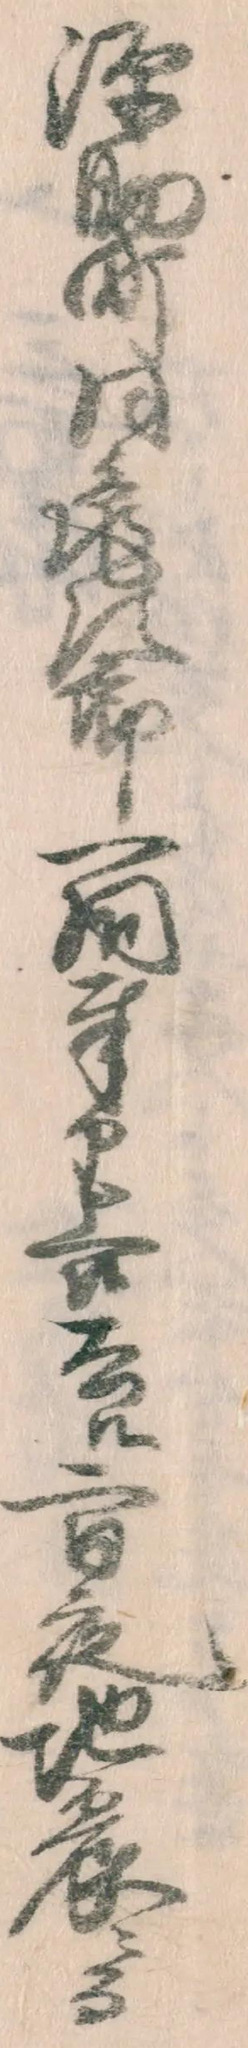源助町同亀次郎一同奉申上候去ル二日夜地震ニ而
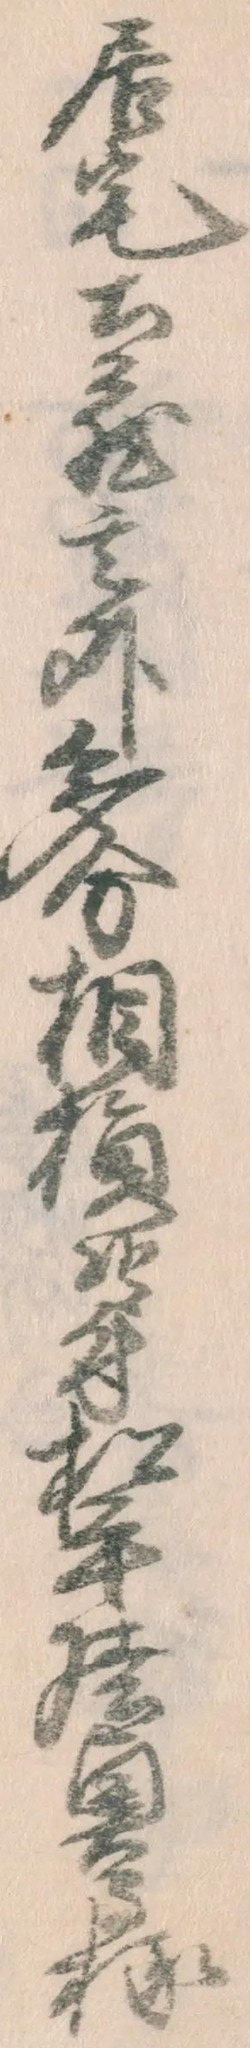居宅土蔵其外多分相損候ニ付松平陸奥守様
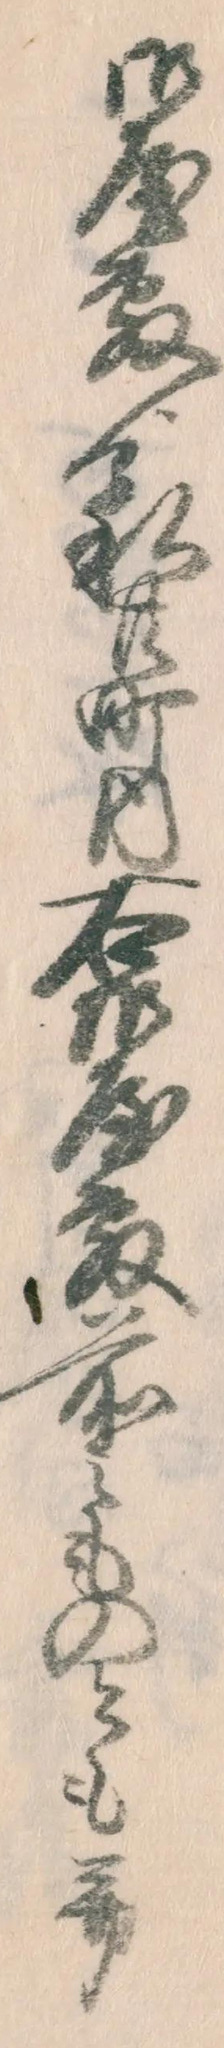御屋敷ゟ私共町内右御屋敷前之ものとも并
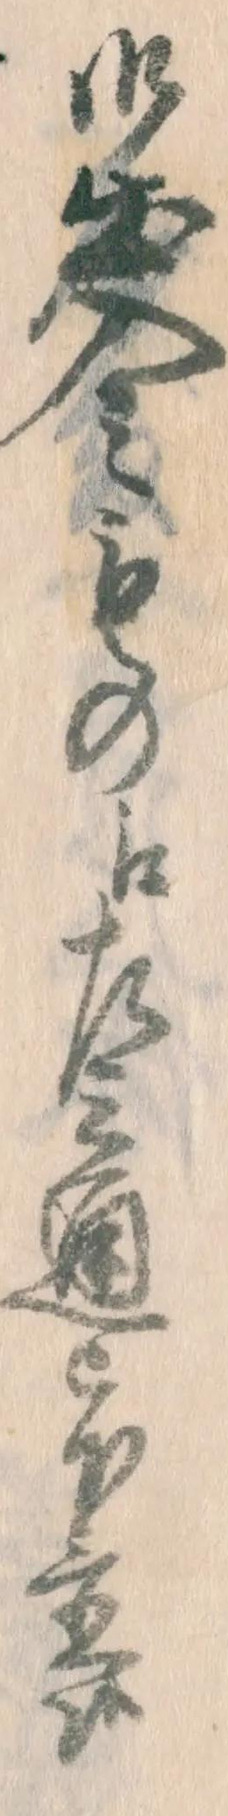御出入之ものえ左之通被下置候

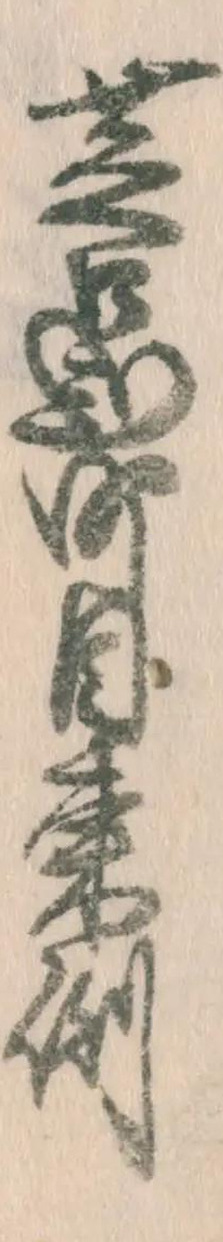芝口弐町目東側
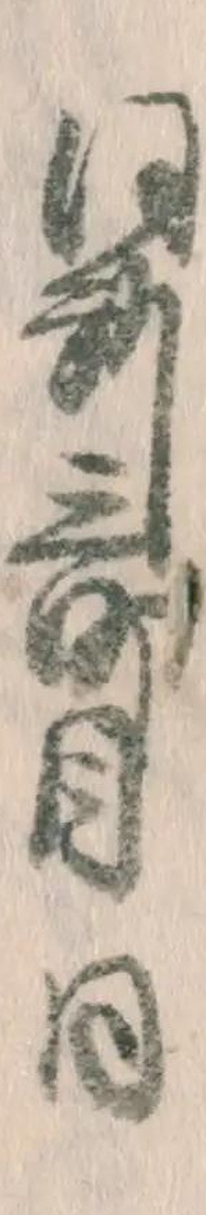同所三町目同
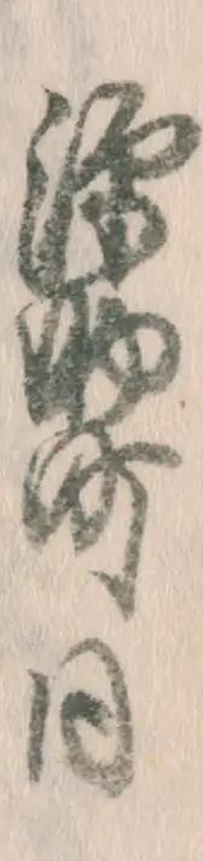源助町同
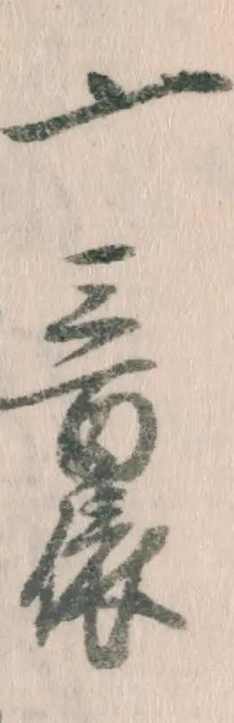〆三百俵
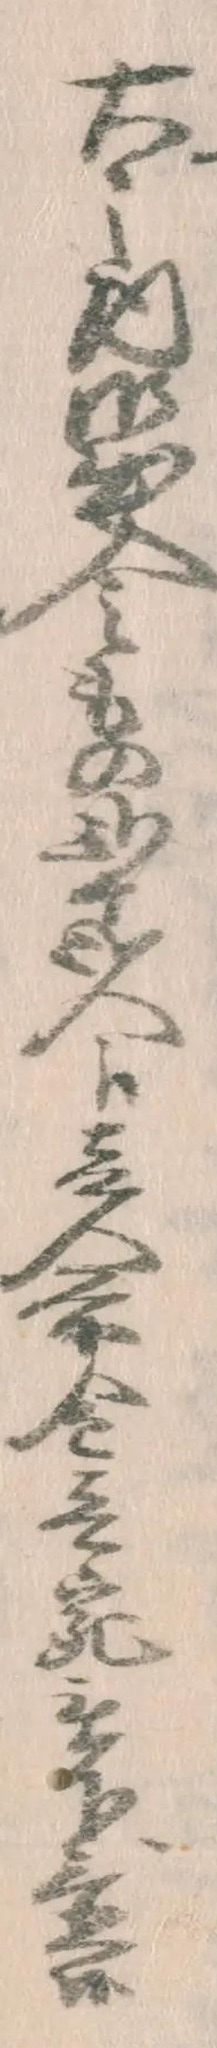右之内御出入之もの弐十弐人え壱人前金壱宛被下置候
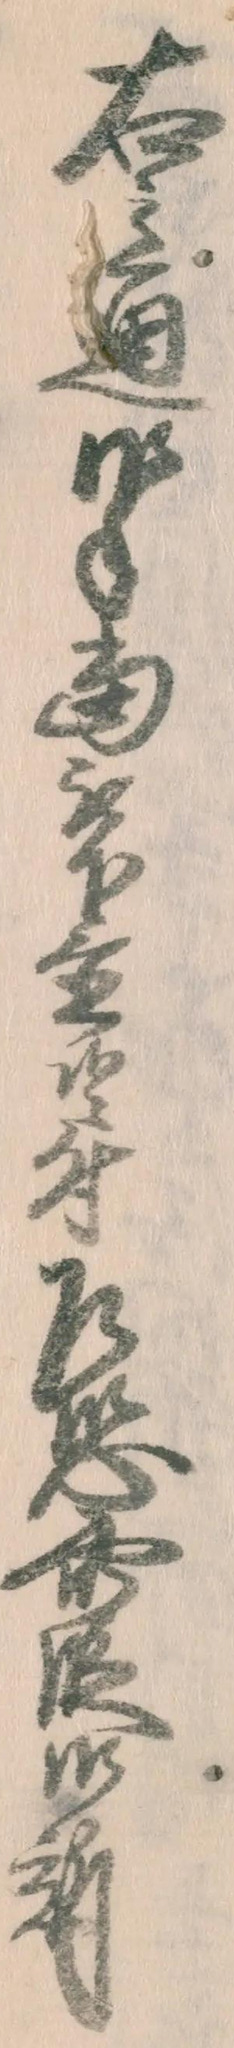右之通御手当被下置候ニ付乍恐此段御訴
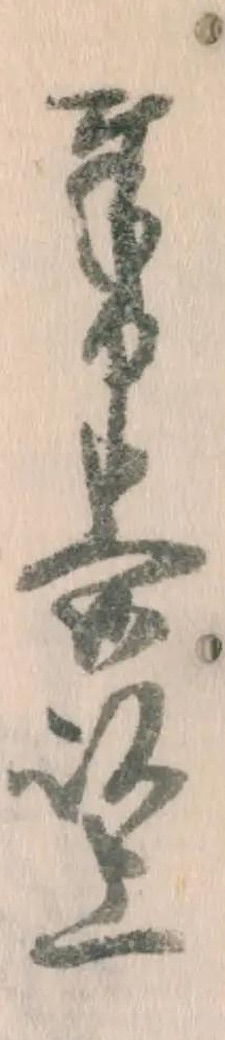奉申上候以上
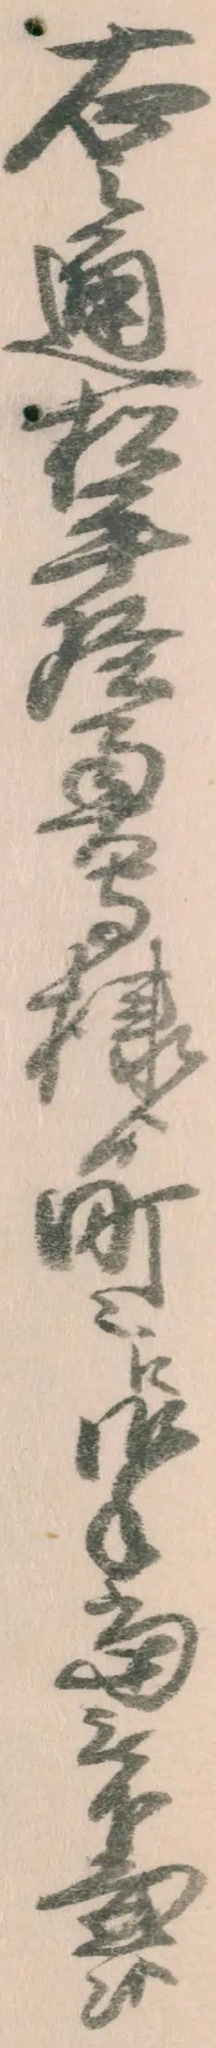右之通松平陸奥守様ゟ町々え御手当被下置候
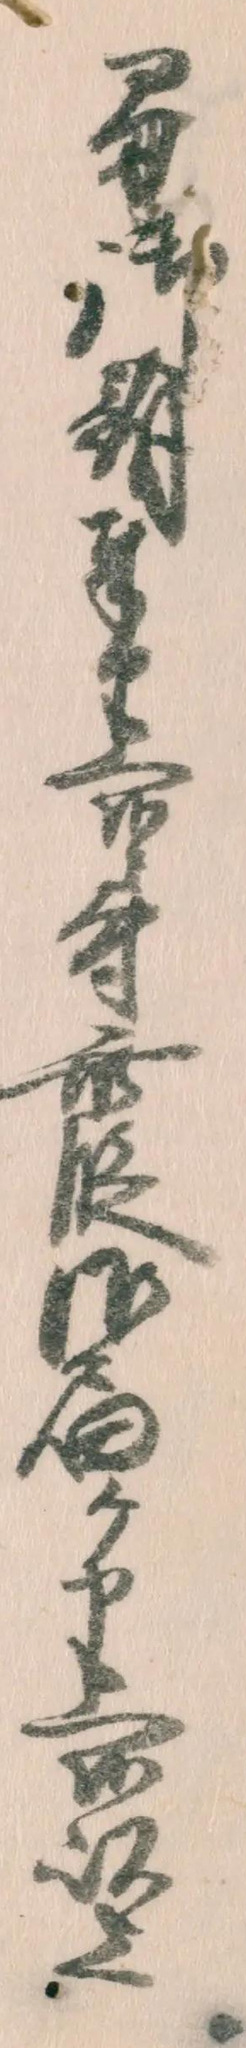間御訴奉申上候ニ付此段御届ケ申上候以上
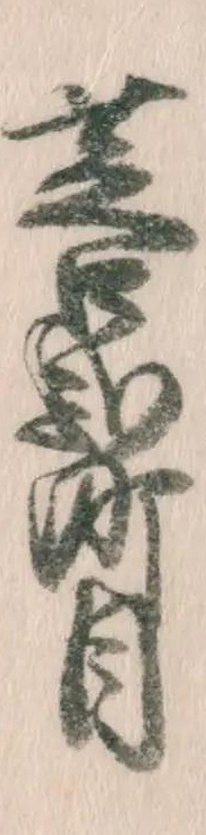芝口弐町目
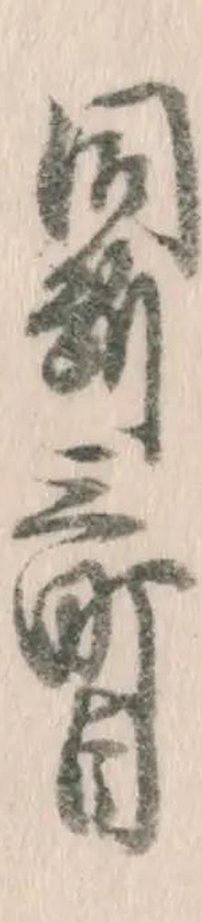同所三町目
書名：武家方并寺院等ニテ施差出候一件
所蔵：国立国会図書館 National Diet Library, JAPAN
